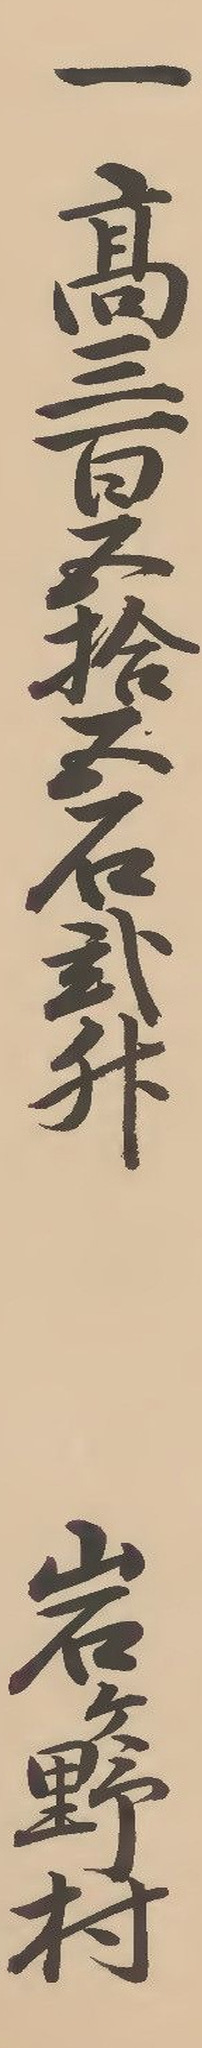一高三百五拾五石弐升岩ヶ野村
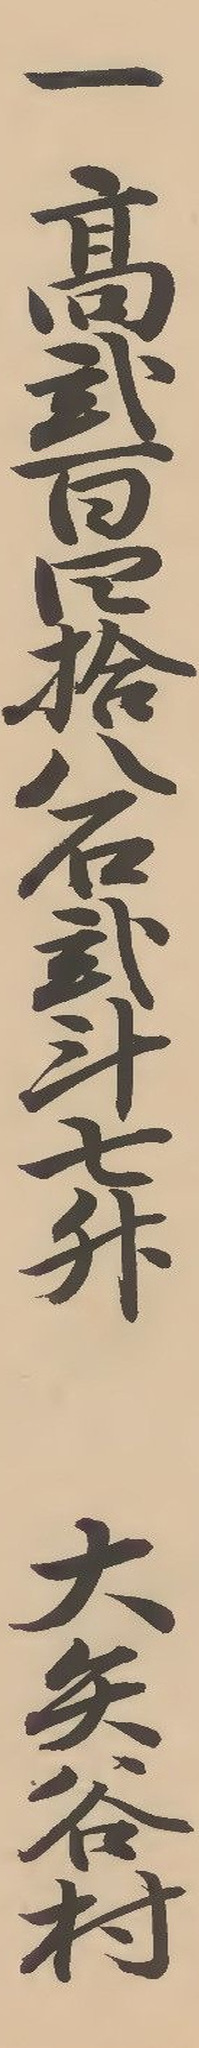一高弐百四拾八石弐斗七升大矢谷村
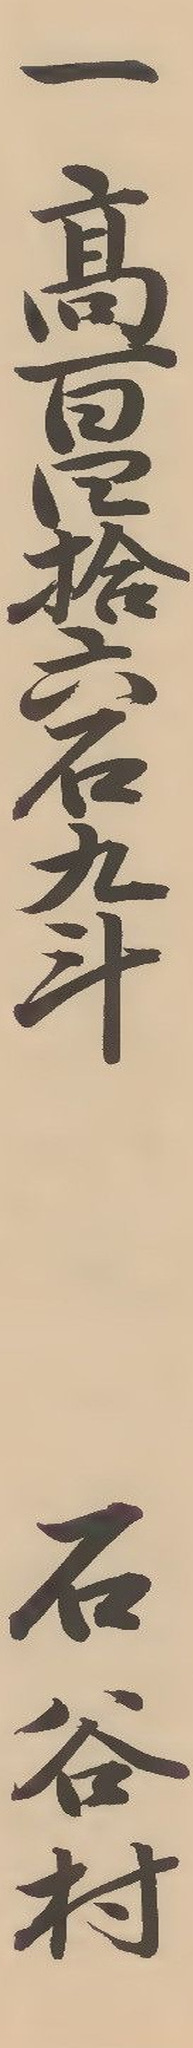一高百四拾六石九斗石谷村
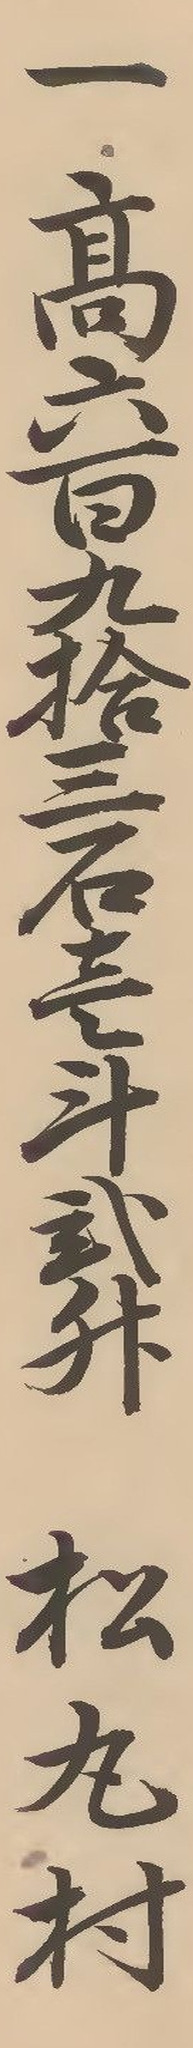一高六百九拾三石壱斗弐升松丸村

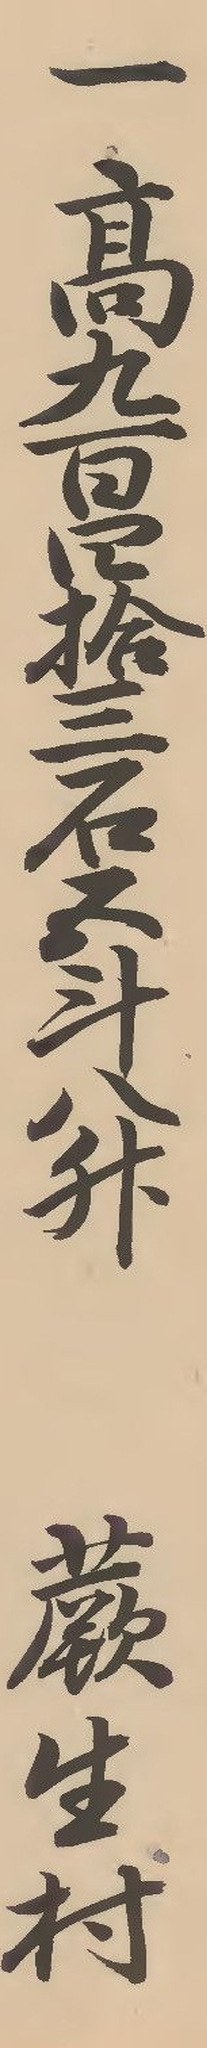一高九百四拾三石五斗八升蕨生村
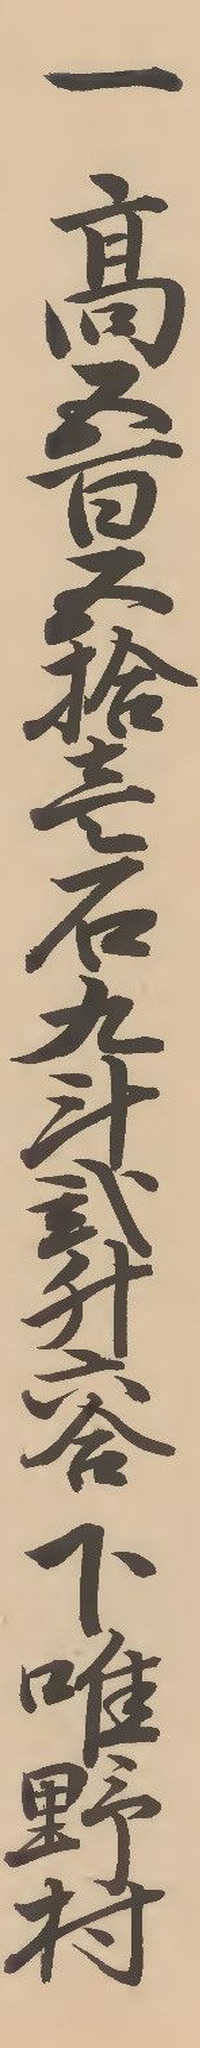一高五百五拾壱石九斗弐升六合下唯野村
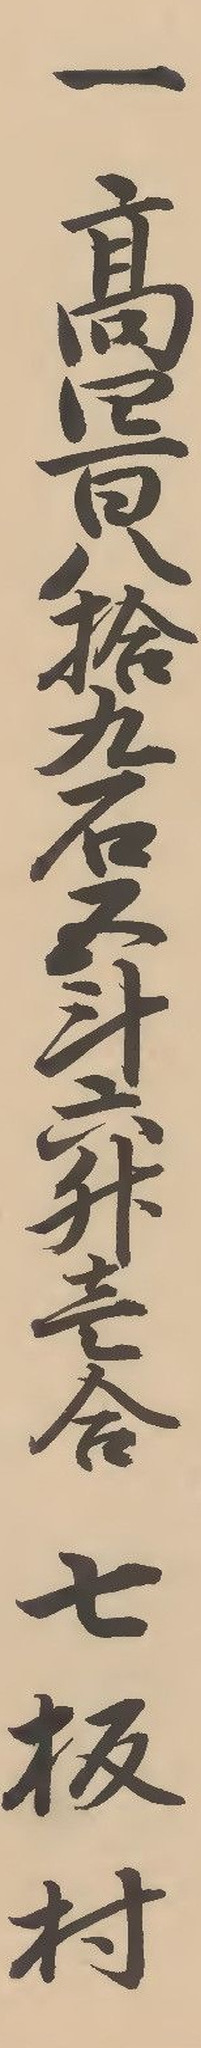一高四百八拾九石五斗六升壱合七板村
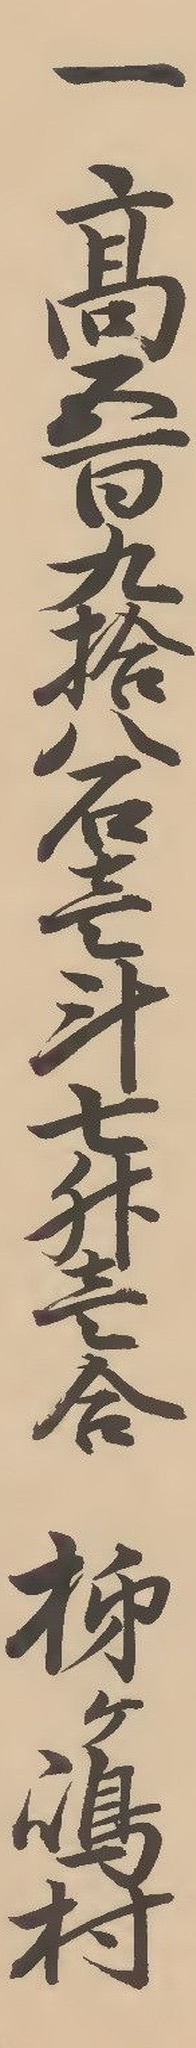一高五百九拾八石壱斗七升壱合柿ヶ島村
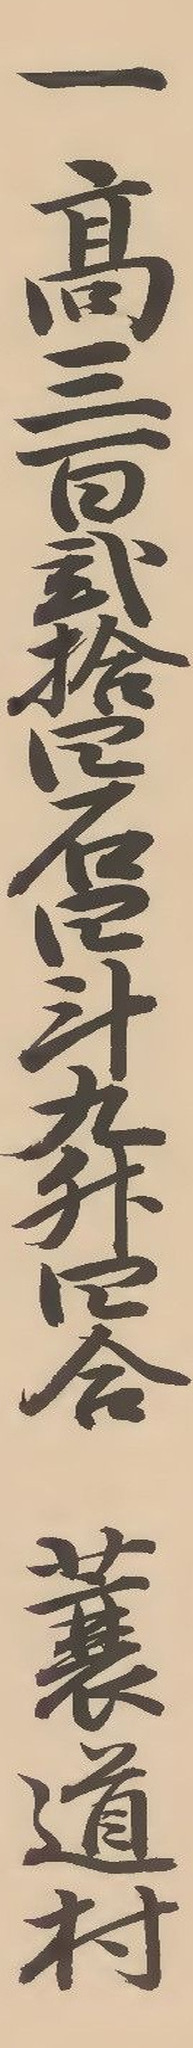一高三百弐拾四石四斗九升四合蓑道村
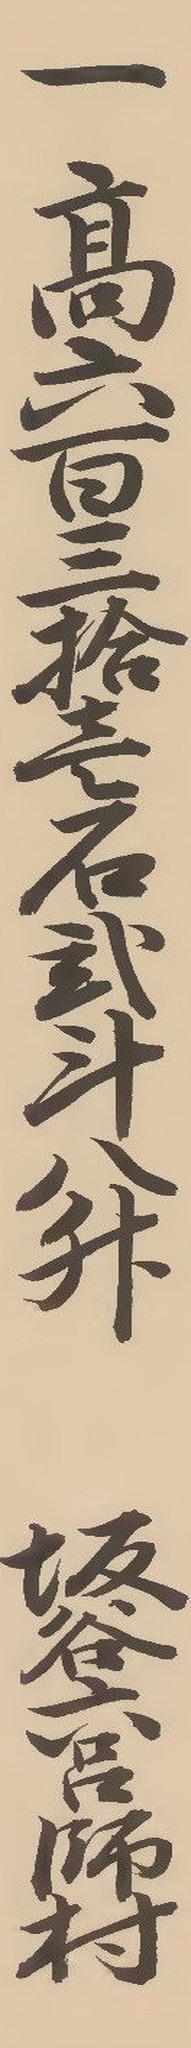一高六百三拾壱石弐斗八升坂谷六呂師村
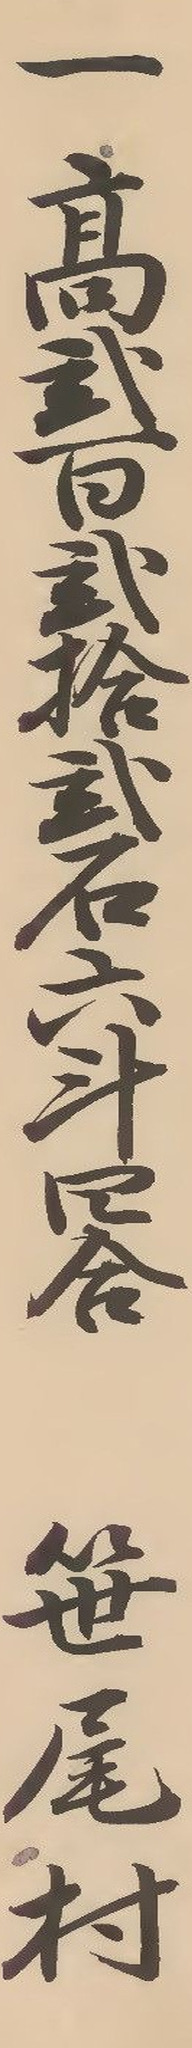一高弐百弐拾弐石六斗四合笹尾村

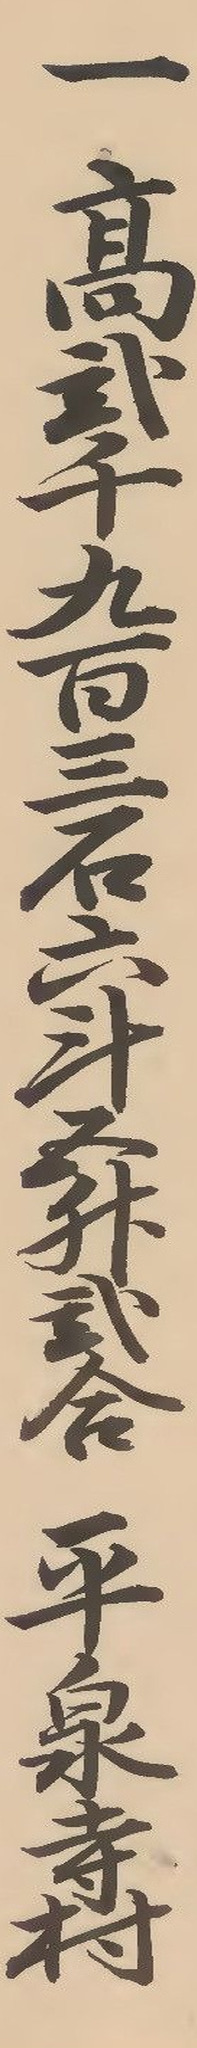一高弐千九百三石六斗五升弐合平泉寺村
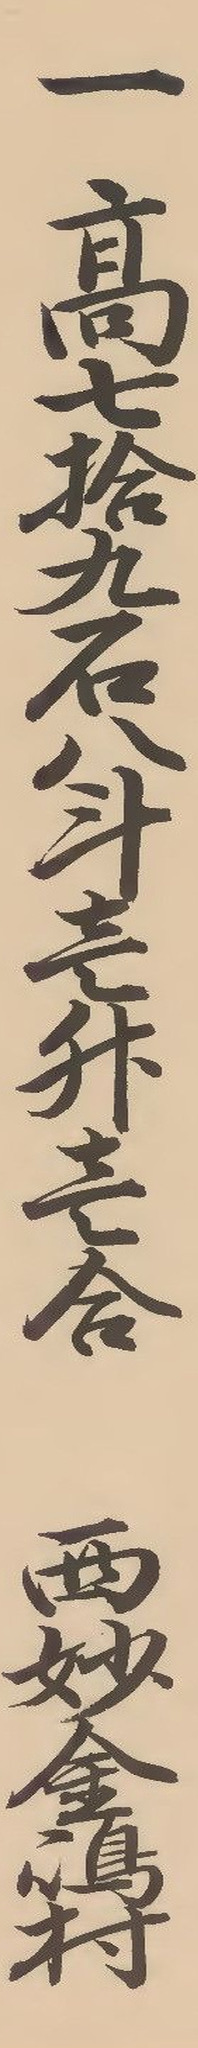一高七拾九石八斗壱升壱合西妙金島村
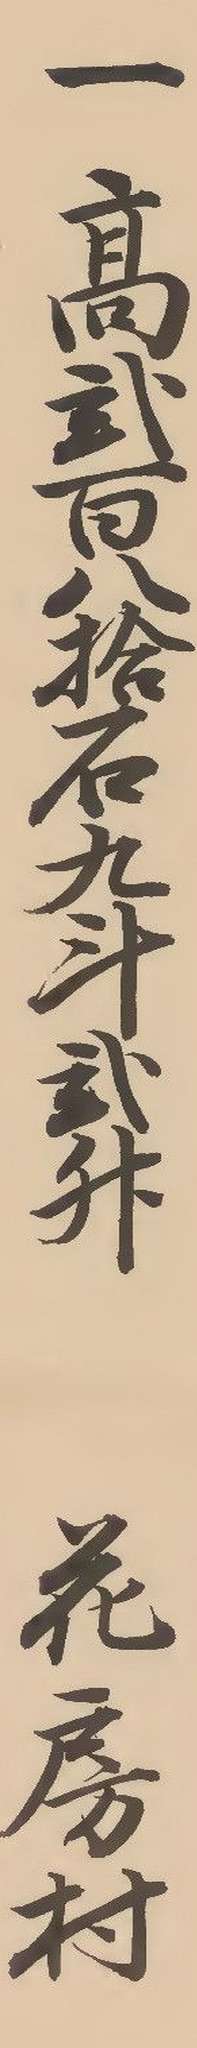一高弐百八拾石九斗弐升花房村
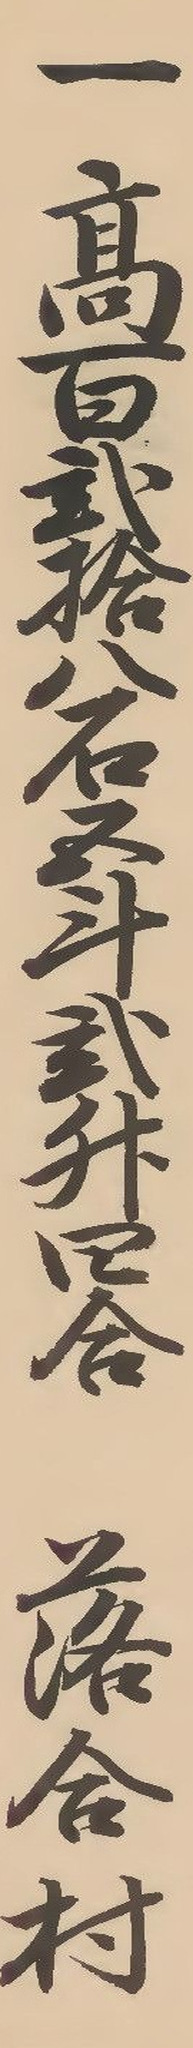一高百弐拾八石五斗弐升四合落合村
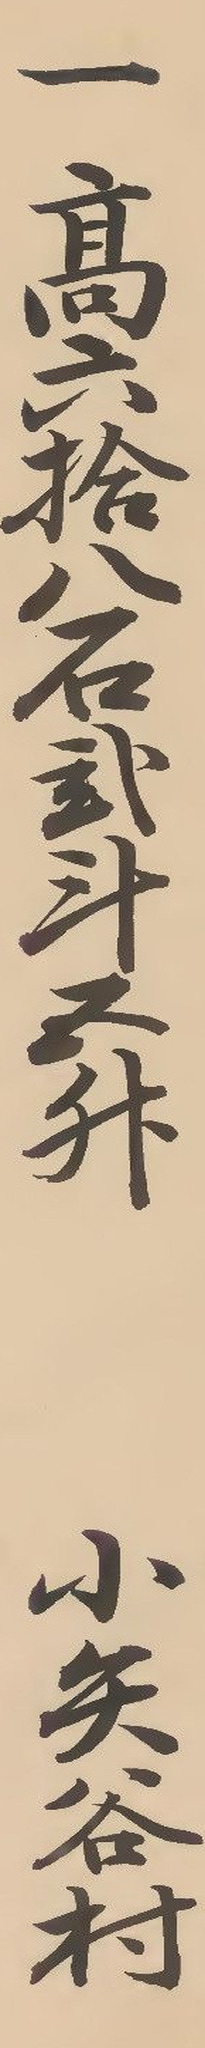一高六拾八石弐斗五升小矢谷村
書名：越前国郷帳
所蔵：国立公文書館 National Archives of Japan
